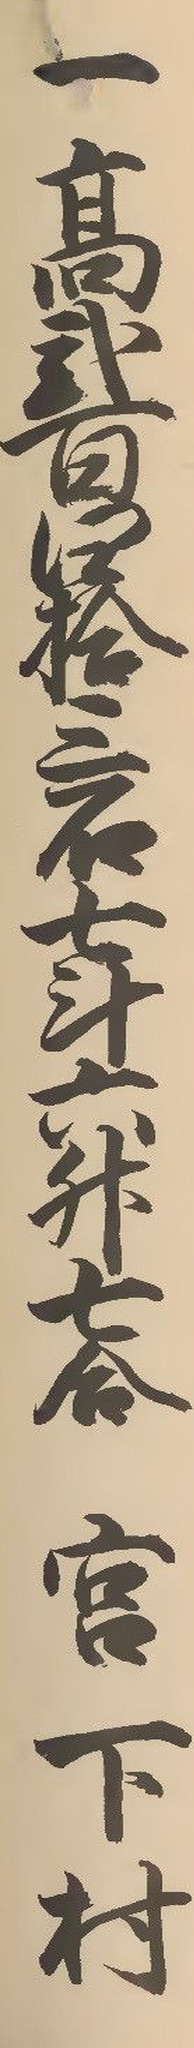一高弐百四拾三石七斗六升七合宮下村
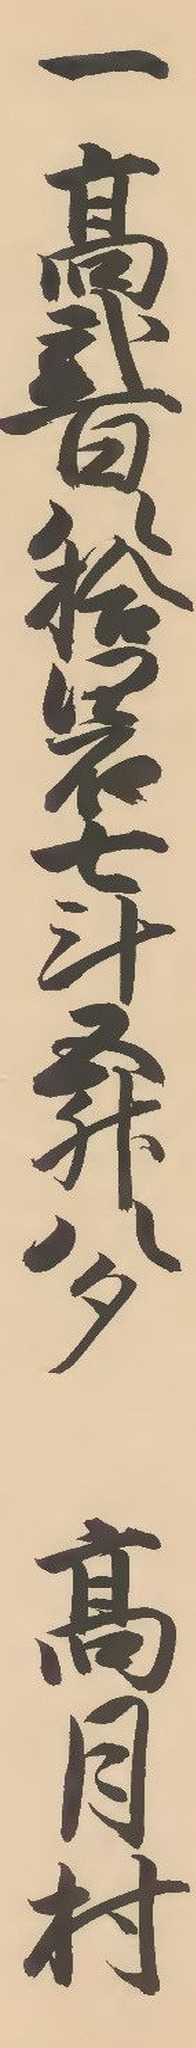一高弐百八拾四石七斗五升八勺高月村
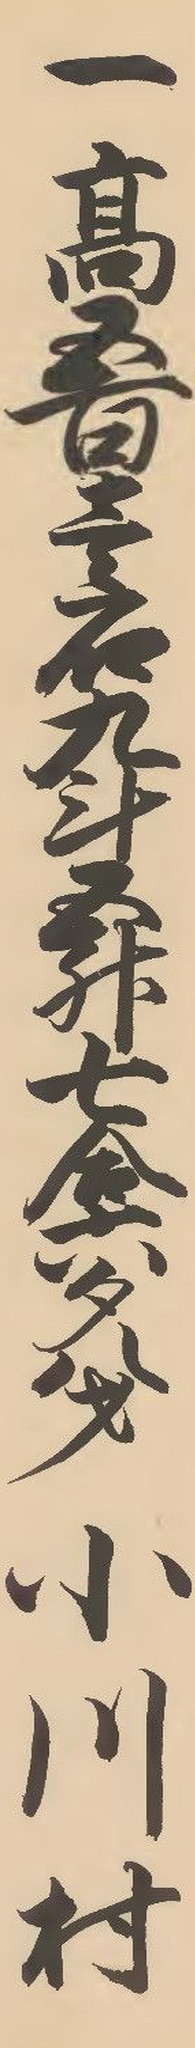一高五百壱石九斗五升七合六勺八才小川村
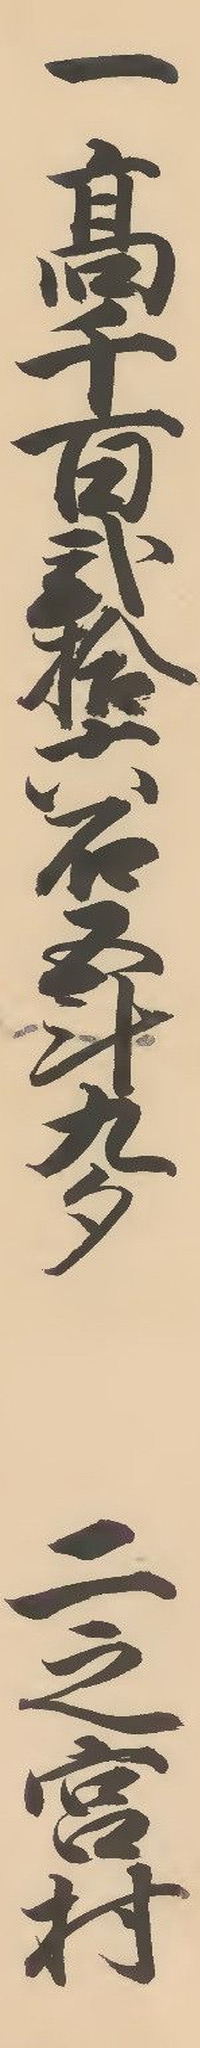一高千百弐拾六石五斗九勺二之宮村

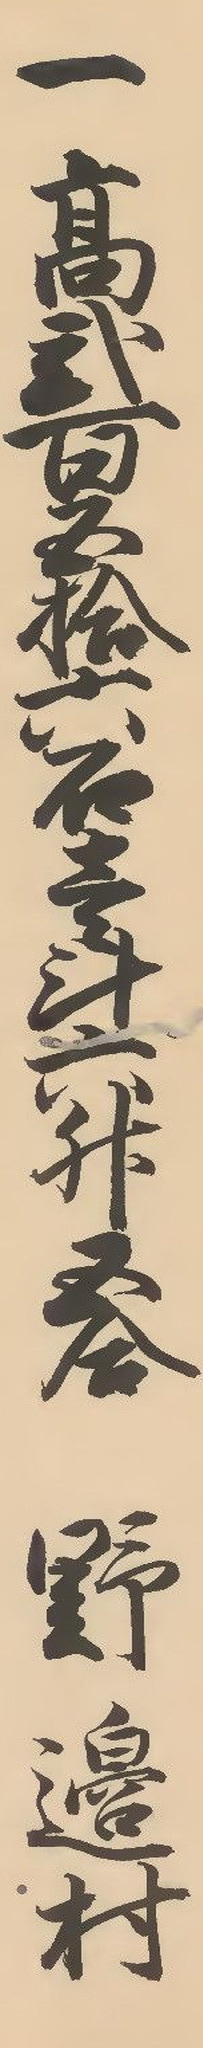一高弐百五拾六石壱斗六升五合野邉村
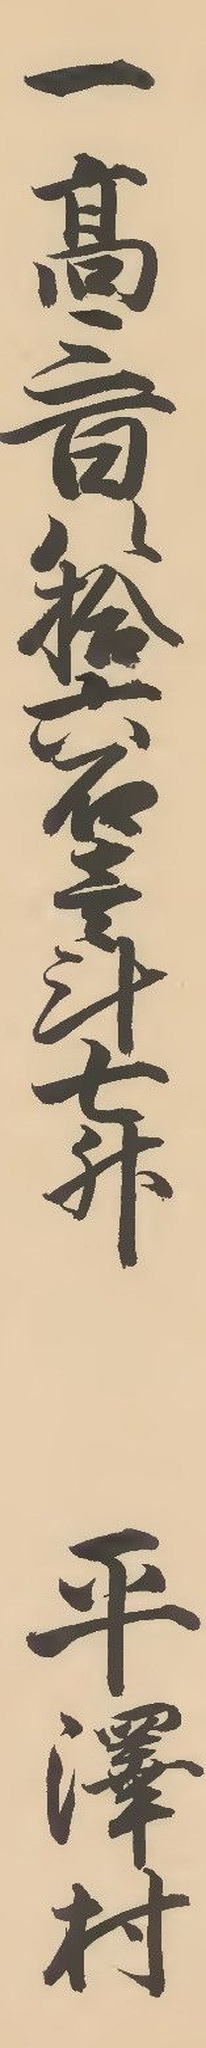一高三百八拾六石壱斗七升平澤村
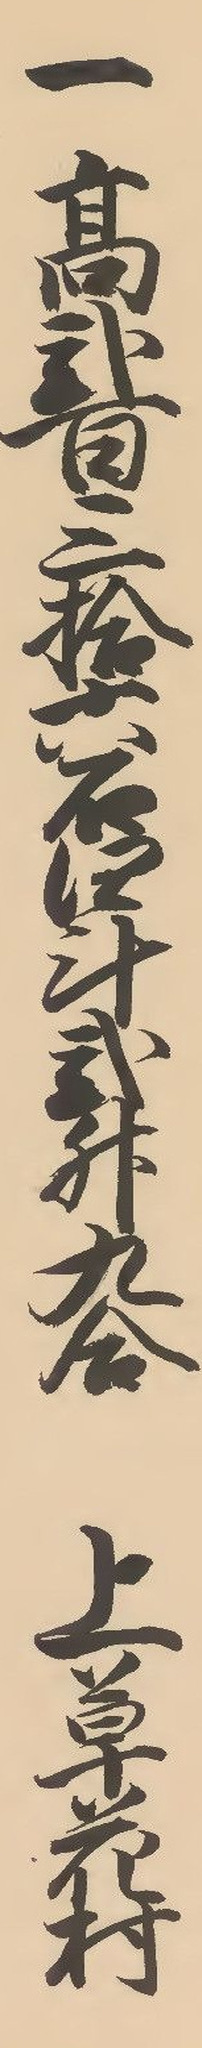一高弐百三拾六石四斗弐升九合上草花村
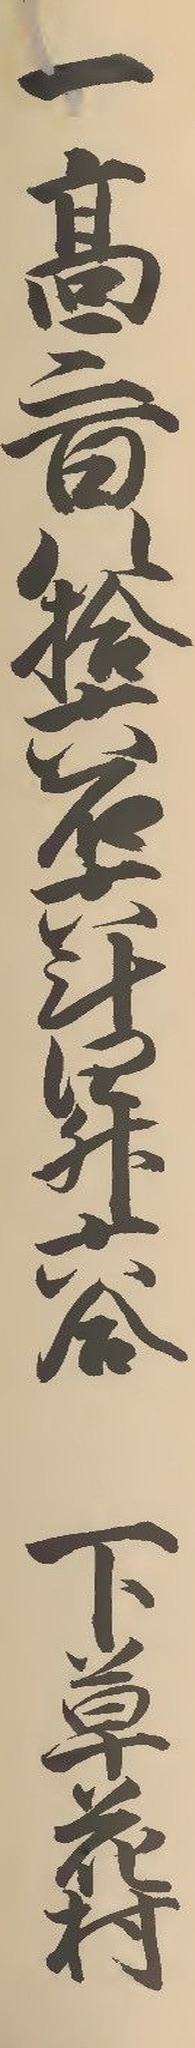一高三百八拾六石六斗四升六合下草花村
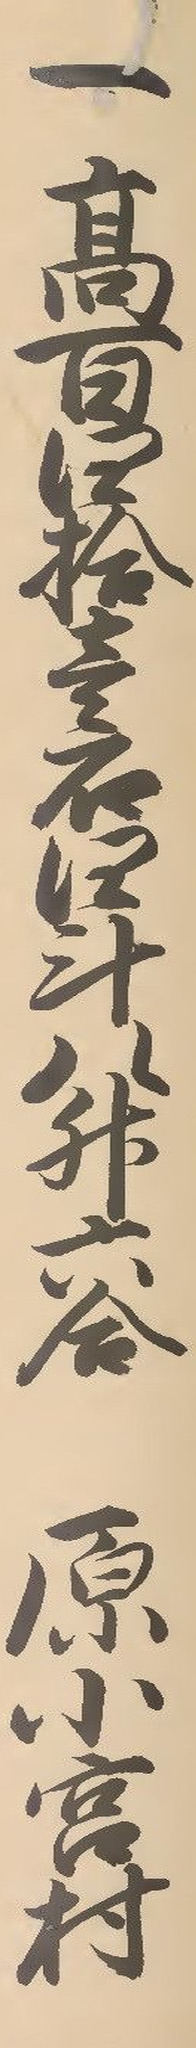一高百四拾壱石四斗八升六合原小宮村
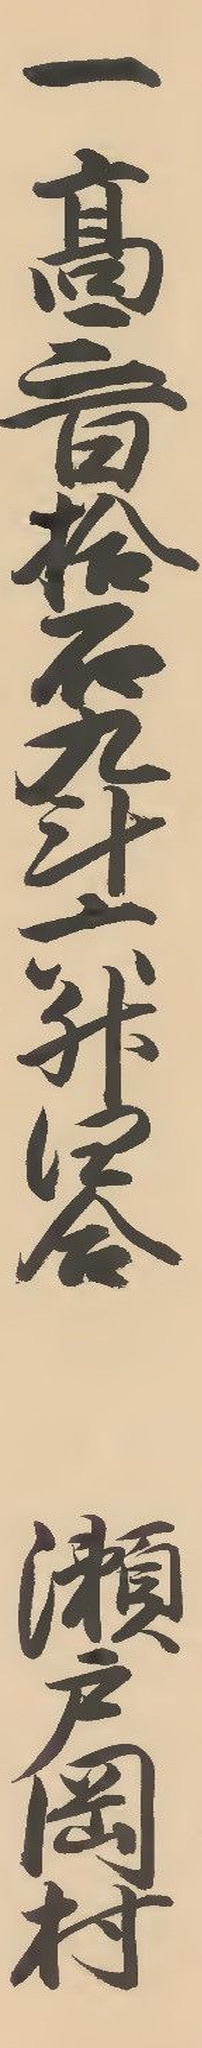一高三百拾石九斗六升四合瀬戸岡村
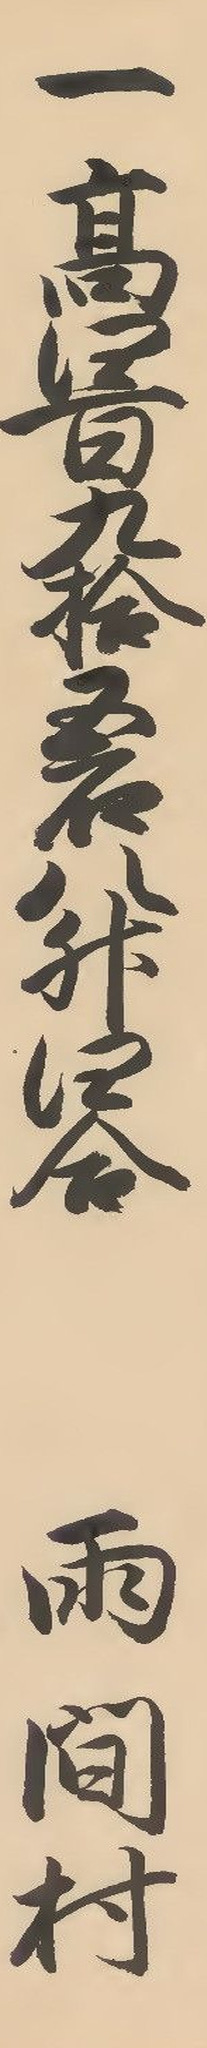一高四百九拾五石八升四合雨間村

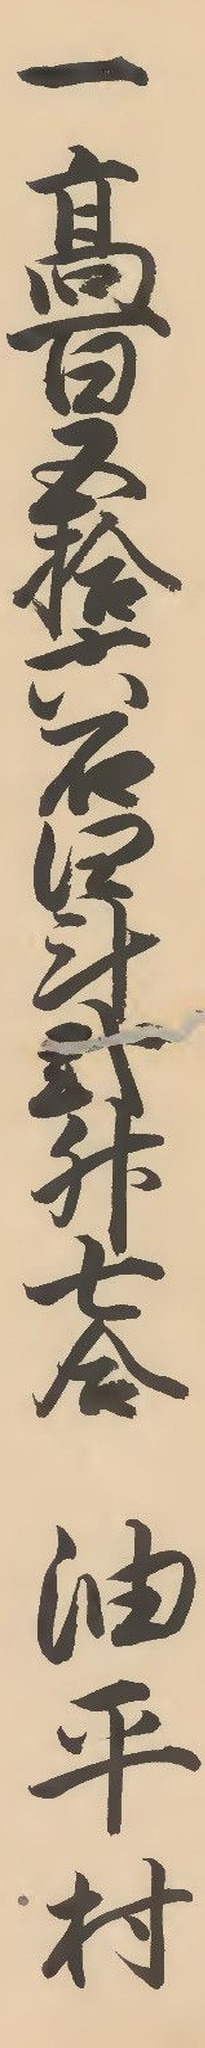一高百五拾六石四斗弐升七合油平村
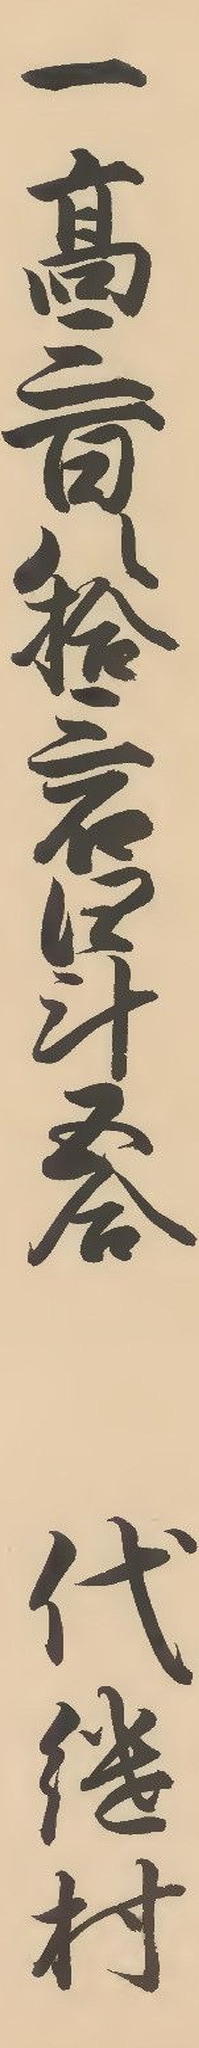一高三百八拾三石四斗五合代継村
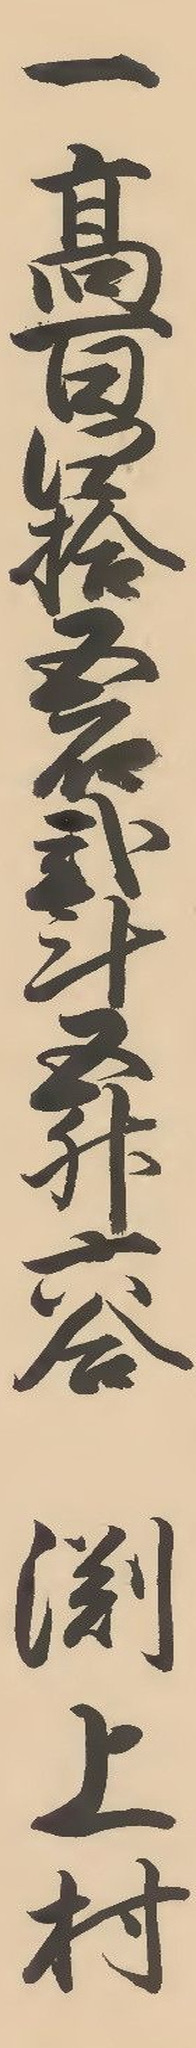一高百四拾五石弐斗五升六合渕上村
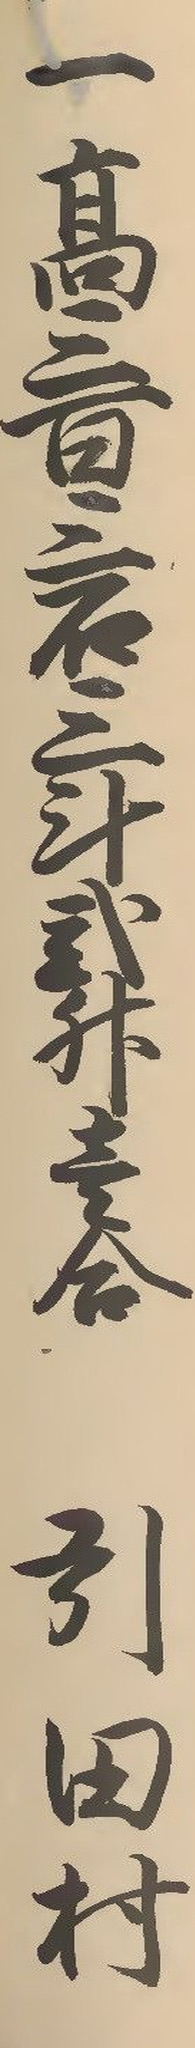一高三百三石三斗弐升壱合引田村
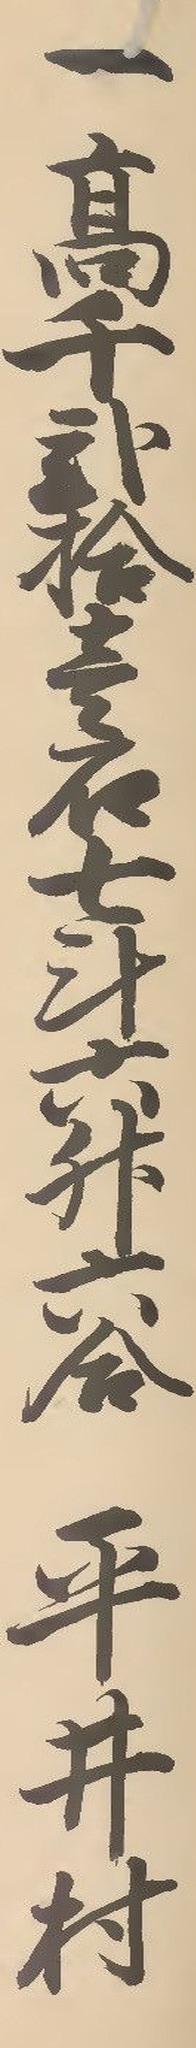一高千弐拾壱石七斗六升六合平井村
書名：武蔵国郷帳　上
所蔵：国立公文書館 National Archives of Japan
